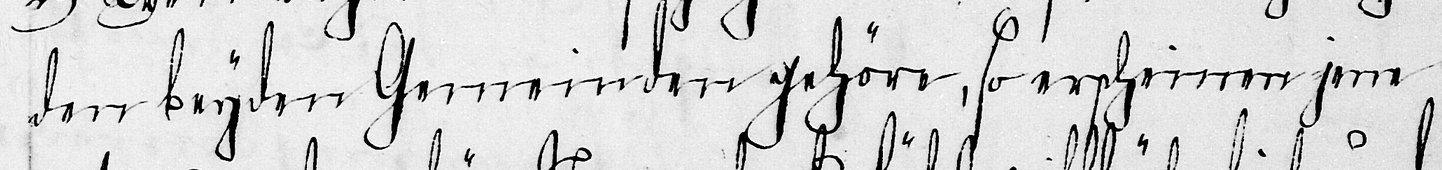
den beyden Gemeinden gehöre, so erscheinen jene
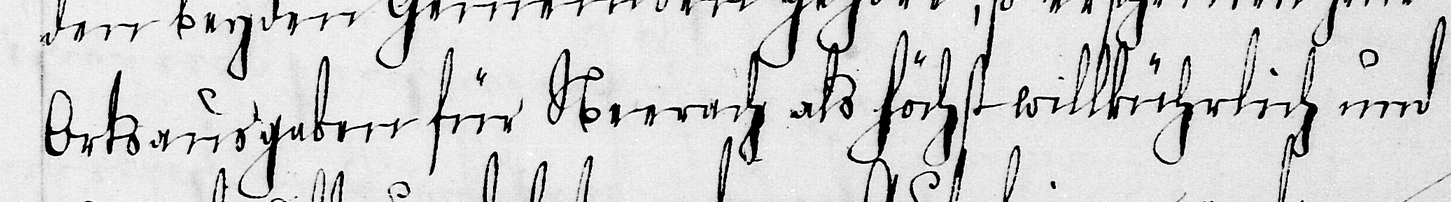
Ortsausgaben für Neerach als höchst willkührlich und
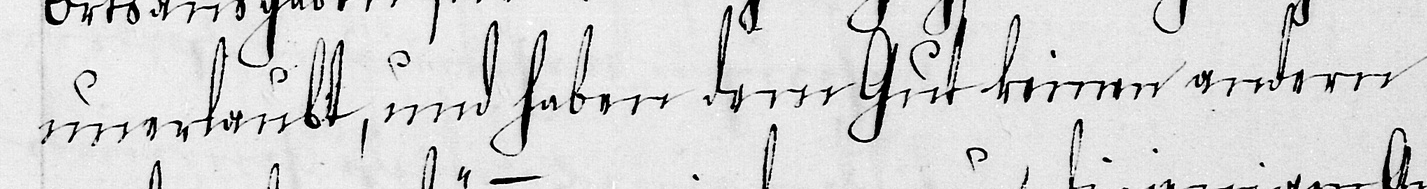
unerlaubt, und haben dem Gut keinen andern
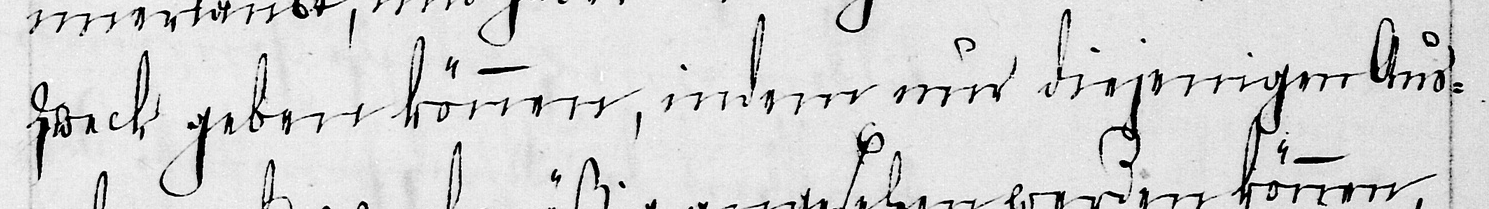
Zweck geben können, indem nur diejenigen Aus¬
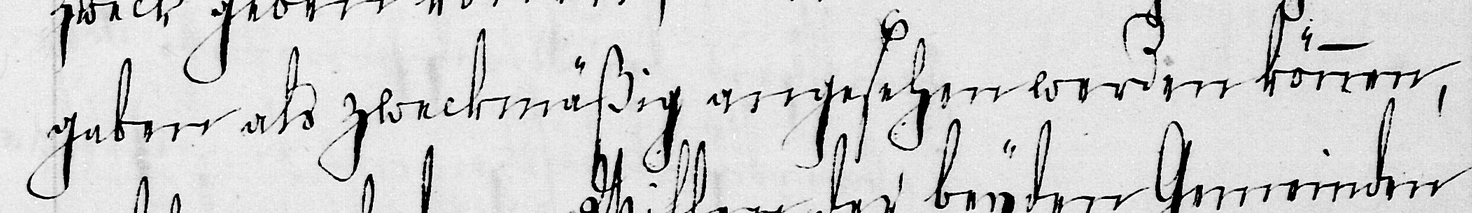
gaben als zweckmäßig angesehen werden können,
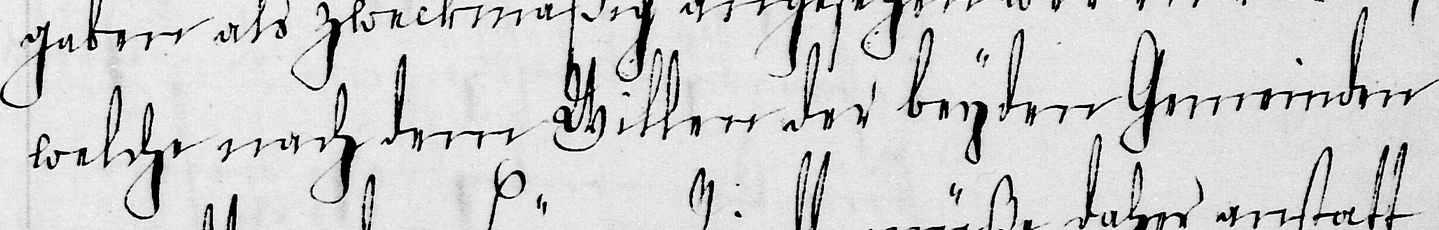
welche nach dem Willen der beyden Gemeinden
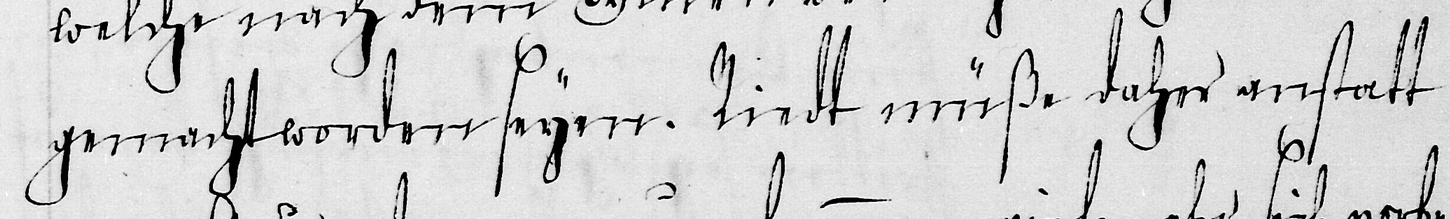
gemacht worden seyen. Riedt müße daher anstatt
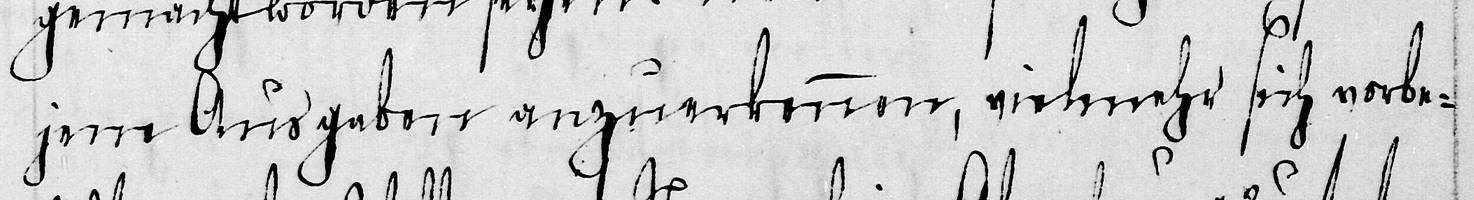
jene Ausgaben anzuerkennen, vielmehr sich vorbe¬
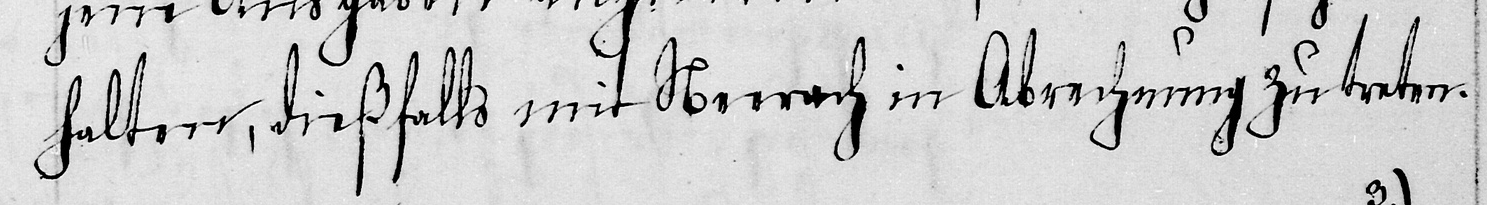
halten, dießfalls mit Neerach in Abrechnung zu treten.
